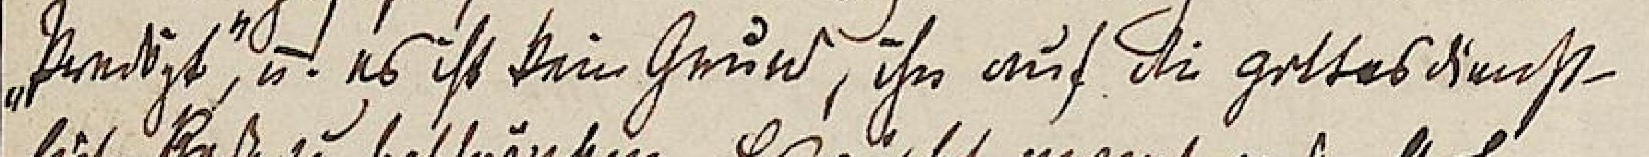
"Predigt", u. es ist kein Grund, ihn auf die gottesdienst¬
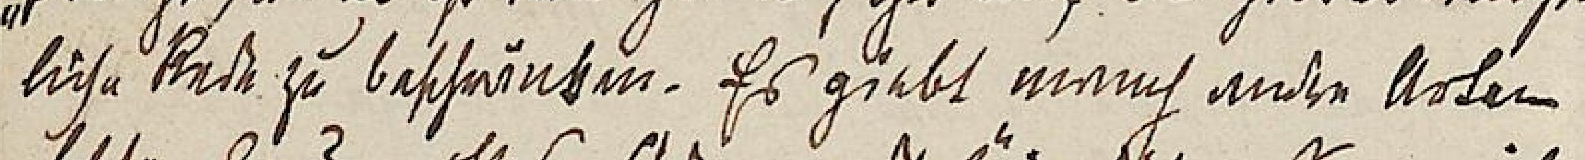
liche Rede zu beschränken. Es gibt noch andere Arten
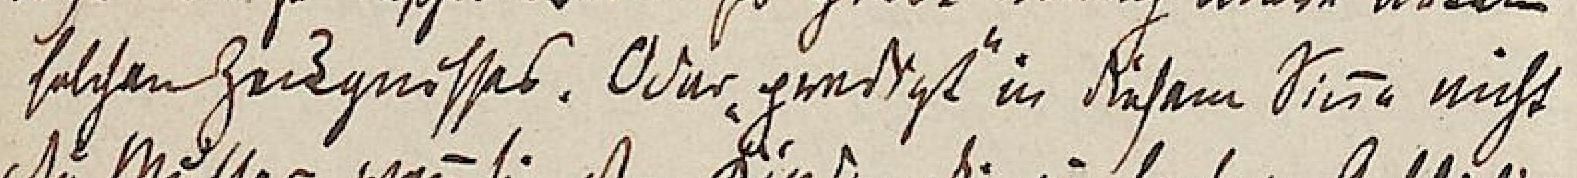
solchen Zeugnisses. Oder "predigt" in diesem Sine nicht
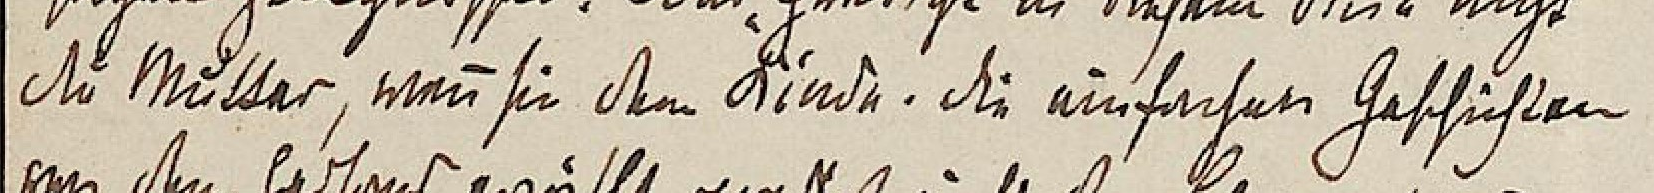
die Mutter, wen sie dem Kinde. die einfachen Geschichten
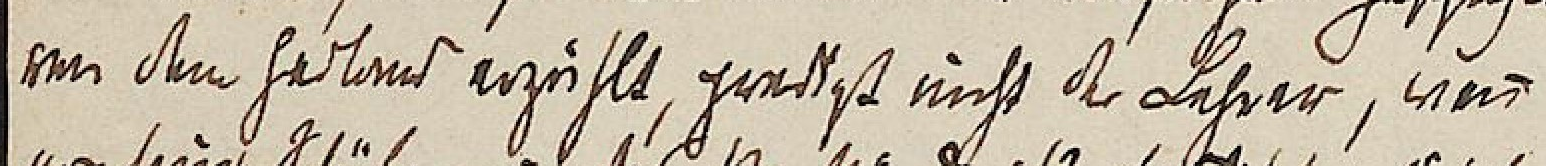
von dem Heiland erzählt, predigt nicht der Lehrer, wen
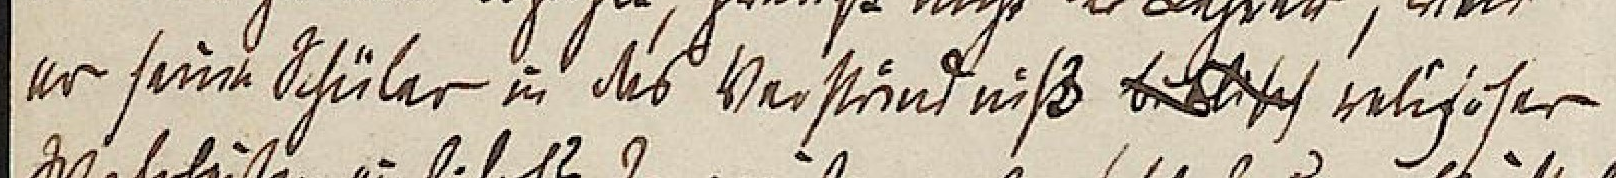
er seinen Schülern in das Verständniß biblisch religiöser
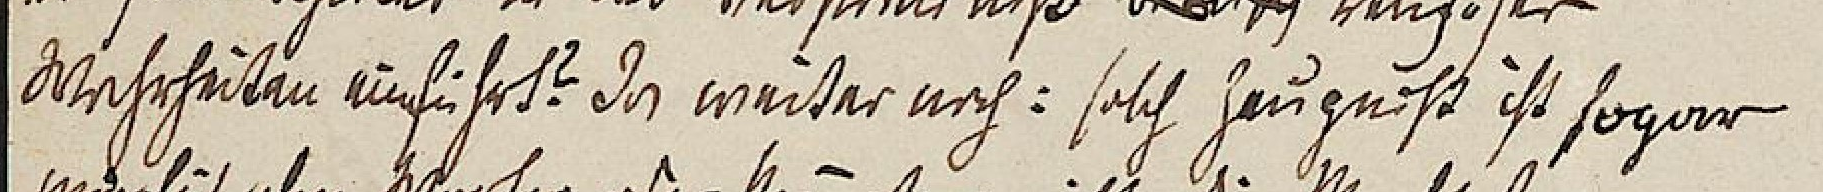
Wahrheiten einführt? Ja weiter noch: solch Zeugnis ist sogar
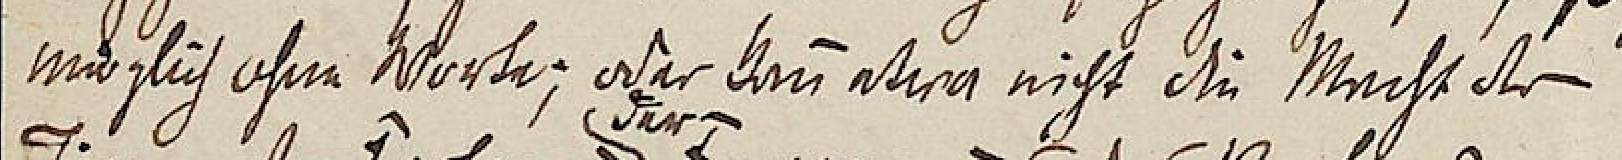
möglich ohne Worte; oder kan etwa nicht die Macht der
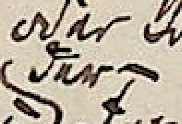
der
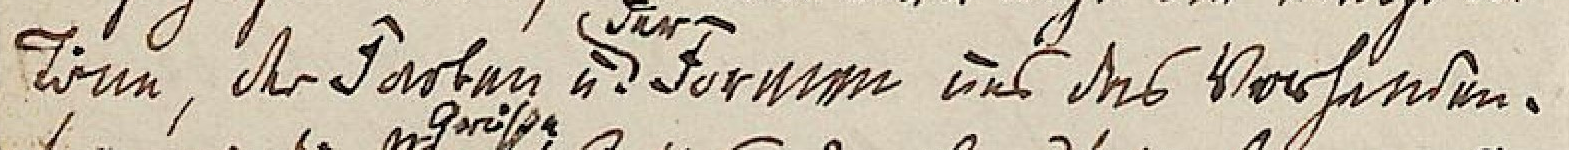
Töne, der Farben und Formen uns das Vorhanden¬
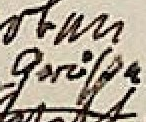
Größe
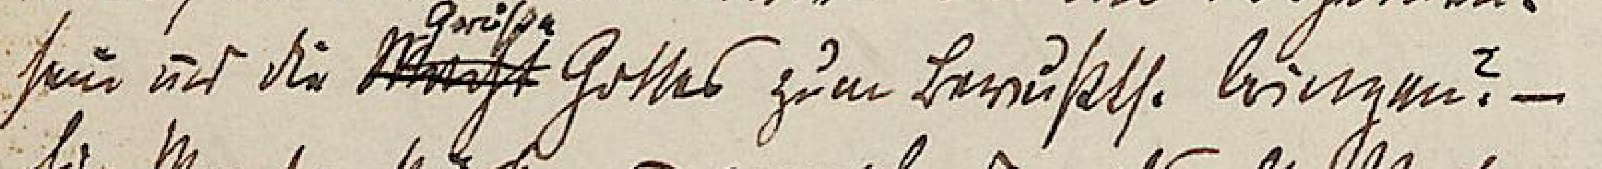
sein und die Macht Gottes zum Bewußts. bringen? _
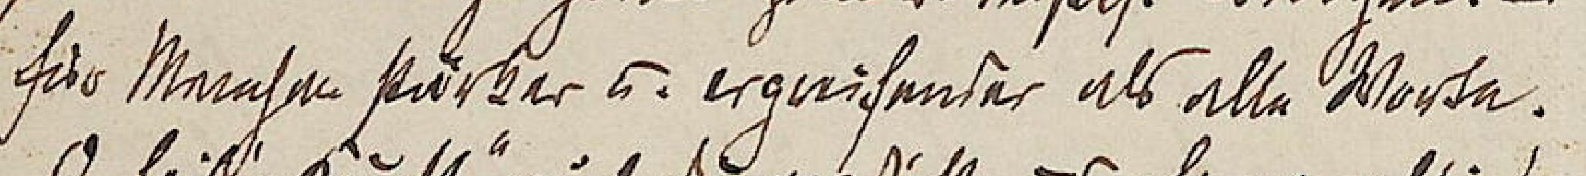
für Manchen stärker u. ergreifender als alle Worten.
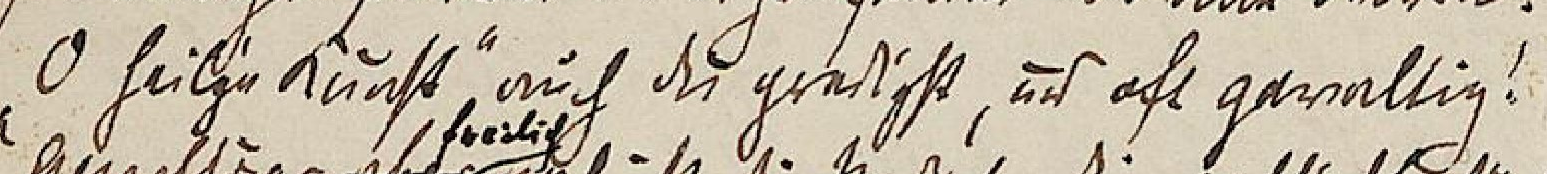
"O heilge Kunst" auch du predigst, und oft gewaltig!
